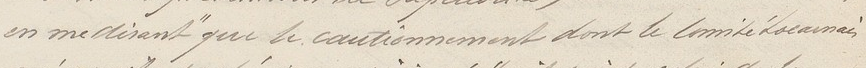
en me disant «que le cautionnement dont le Comité Locarnais
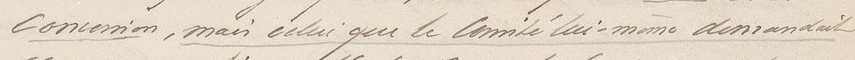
Concession , mais celui que le Comité lui-même demandait
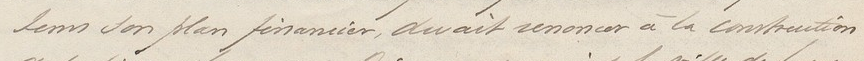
tems son plan financier devait renoncer à la construction
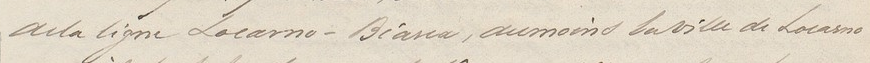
dela ligne Locarno–Biasca, aumoins la ville de Locarno $
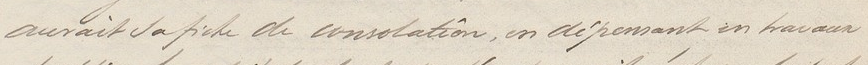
aurait sa fiche de consolation , en dépensant en travaux
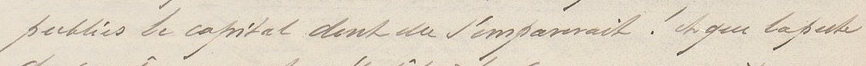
publics le capital dont elle s'emparerait! et que la perte
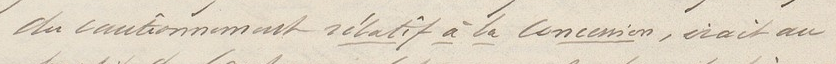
du cautionnement rélatif à la Concession, irait au
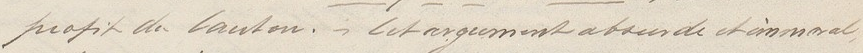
profit du Canton. – Cet argument absurde et immoral,
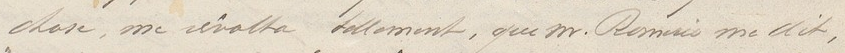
chose, me révolta tellement, que MrRomerio me dit,
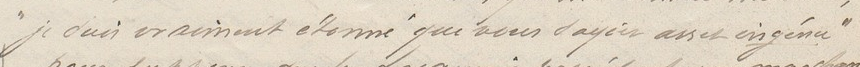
«je suis vraiment étonné que vous soyiez assez ingénu»
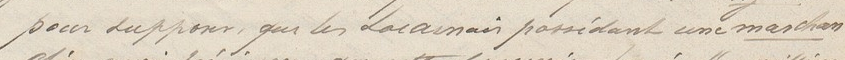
pour supposer, que les Locarnais possédant une marchan-
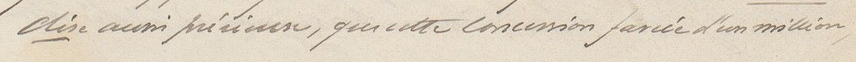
dise aussi précieuse , que cette concession farcie d'un million,
